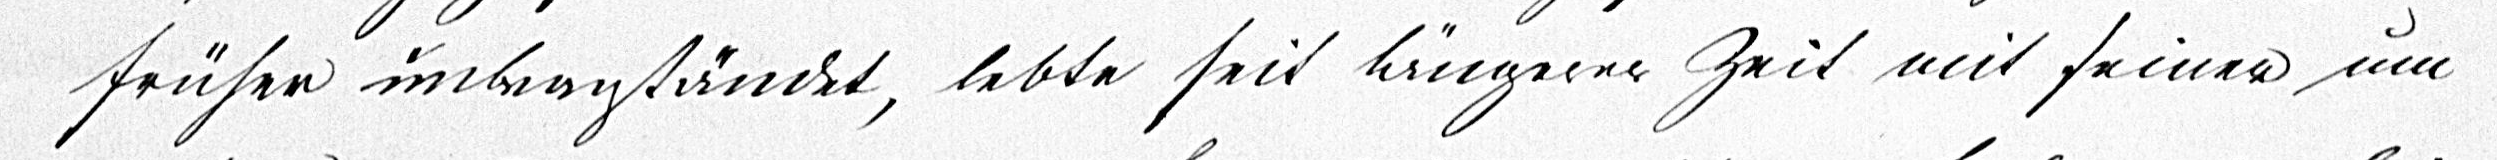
früher unxxständet, lebte seit längerer Zeit mit seiner um
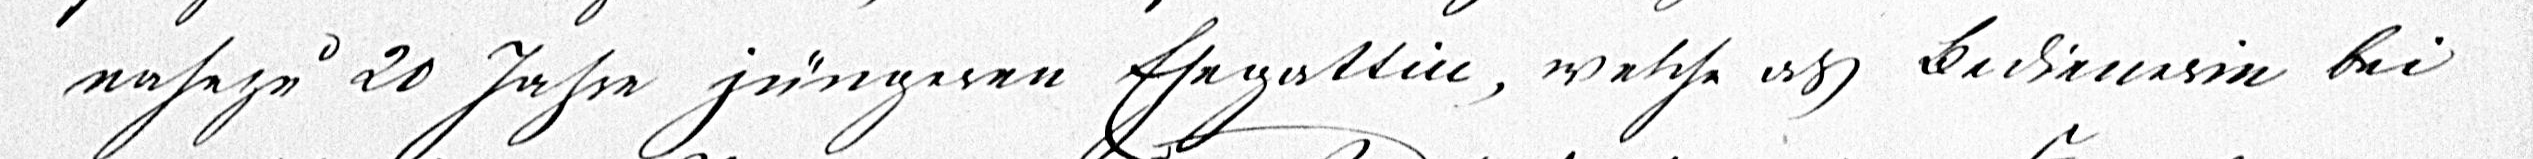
nahezu 20 Jahre jüngeren Ehegattin, welche als Bedienerin bei
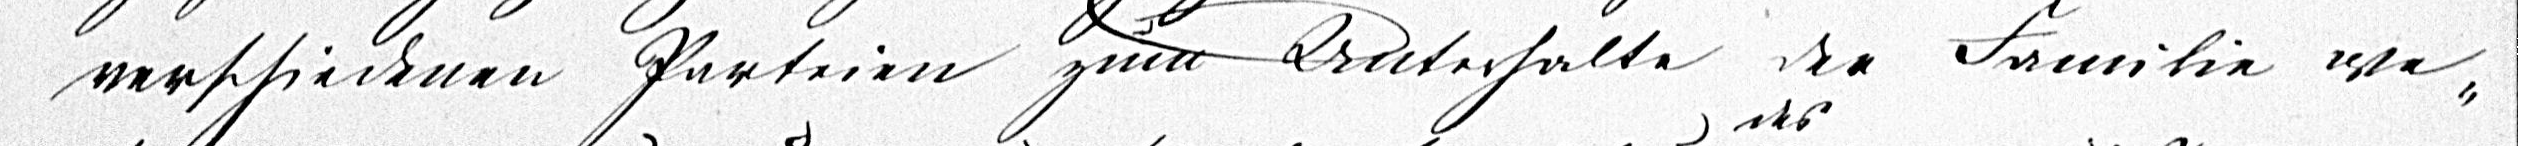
verschiedenen Parteien zum Unterhalte der Familie we¬
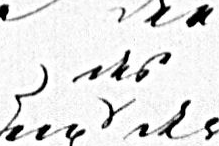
des
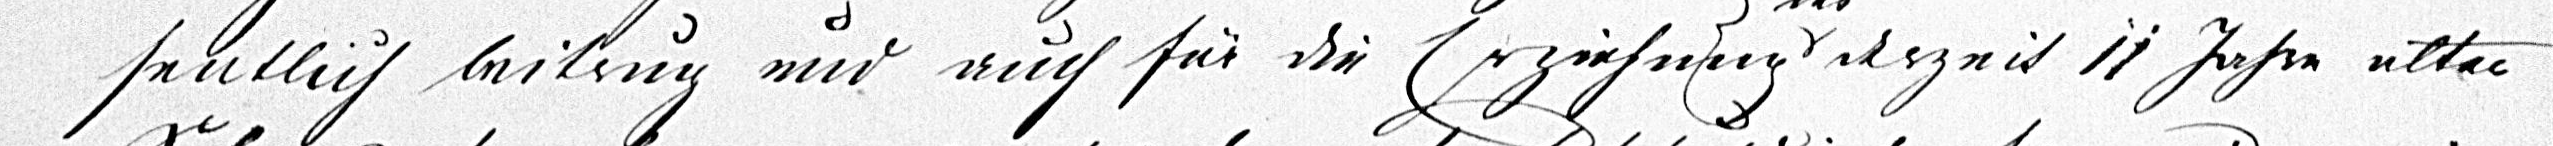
sentlich beitrug und auch für die Erziehung derzeit 11 Jahre eltec
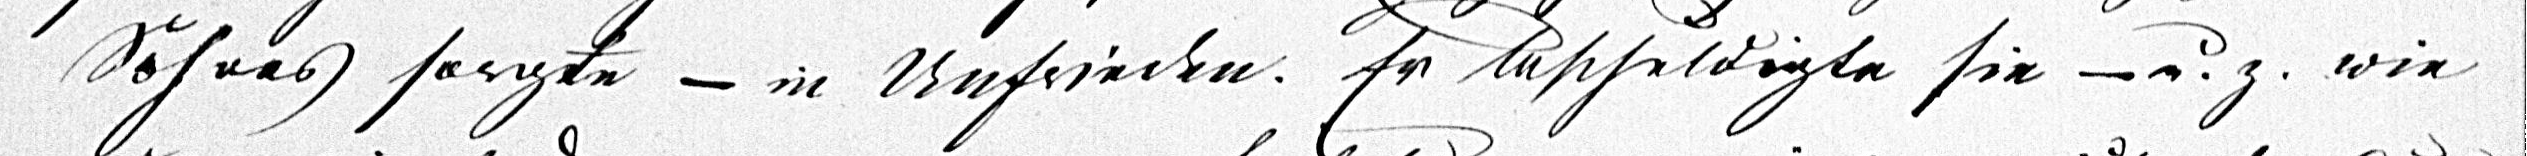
Sohnes sorgte - in Unfrieden. Er beschuldigte sie - u. z. wie
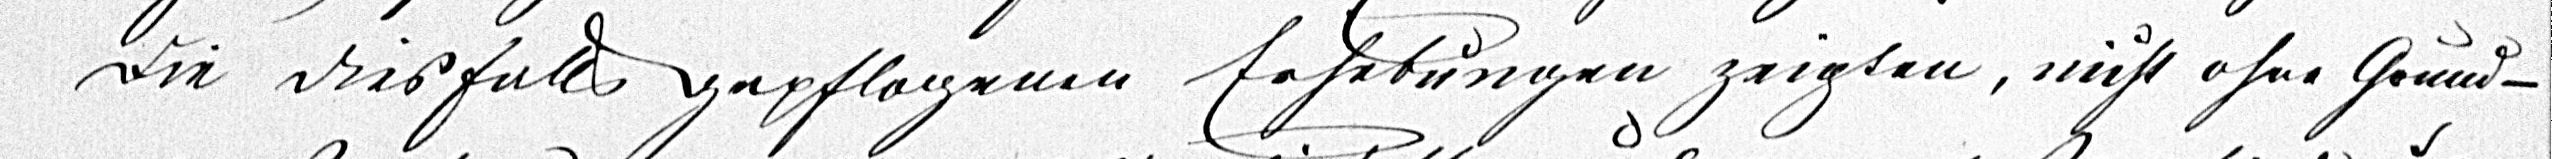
die diesfalls gepflogenen Erhebungen zeigten, nicht ohne Grun¬
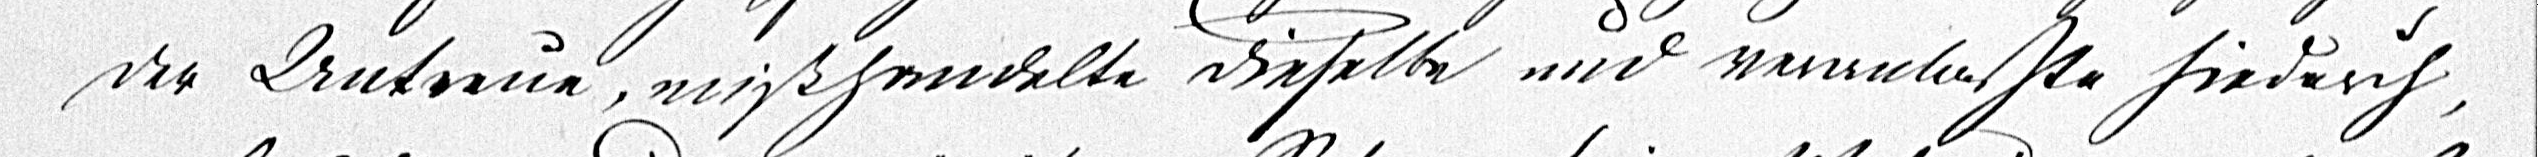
der Untreue, mißhandelte dieselbe und veranlaßte hiederuh,
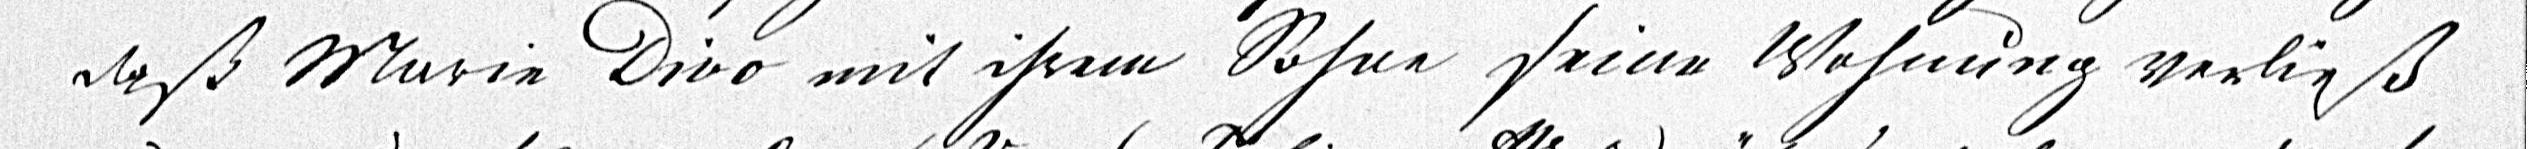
daß Marie Divo mit ihrem Sohne seine Wohnung verließ
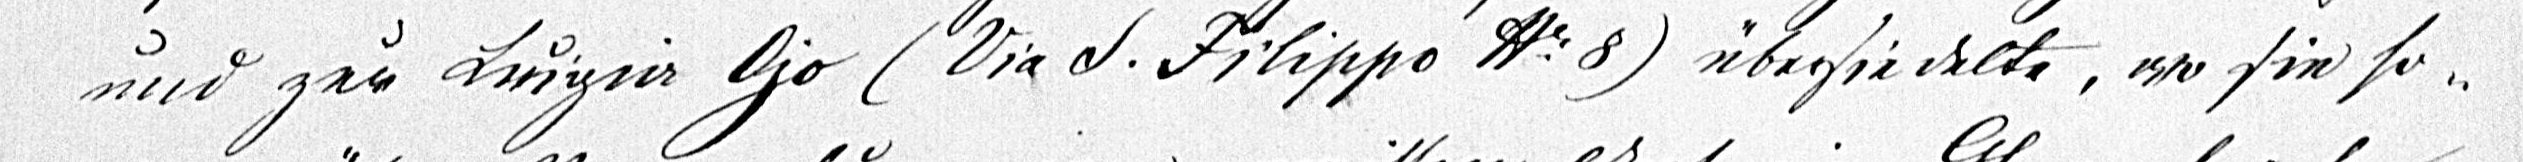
und zur Luigia Ojo (Via S. Filippo xx 8) übersiedelte, xx sie so¬
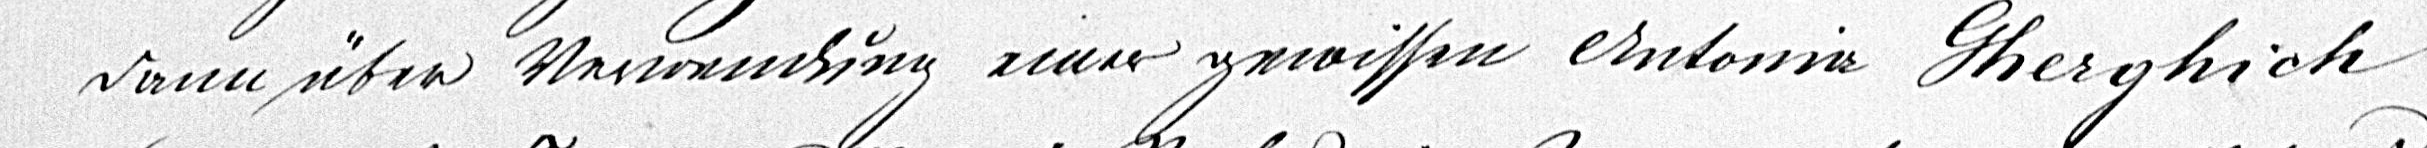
dann über Verwendung einer gewissen Antonia Gherghich
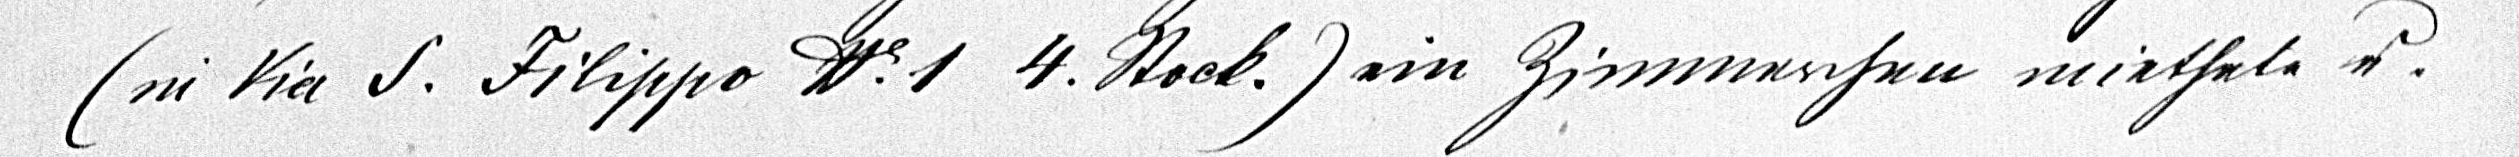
(in Via S. Filippo xx 1 4. Stock.) ein Zimmerchen miethete u.
